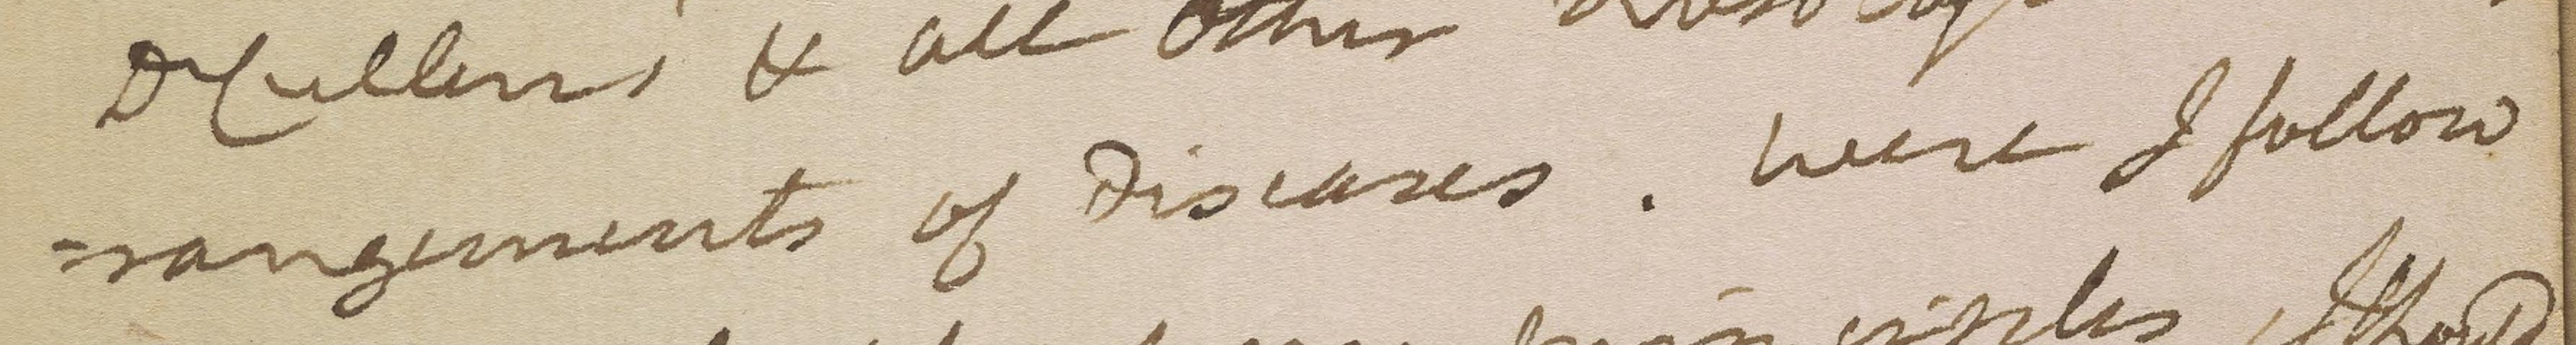rangements of diseases. here I follow
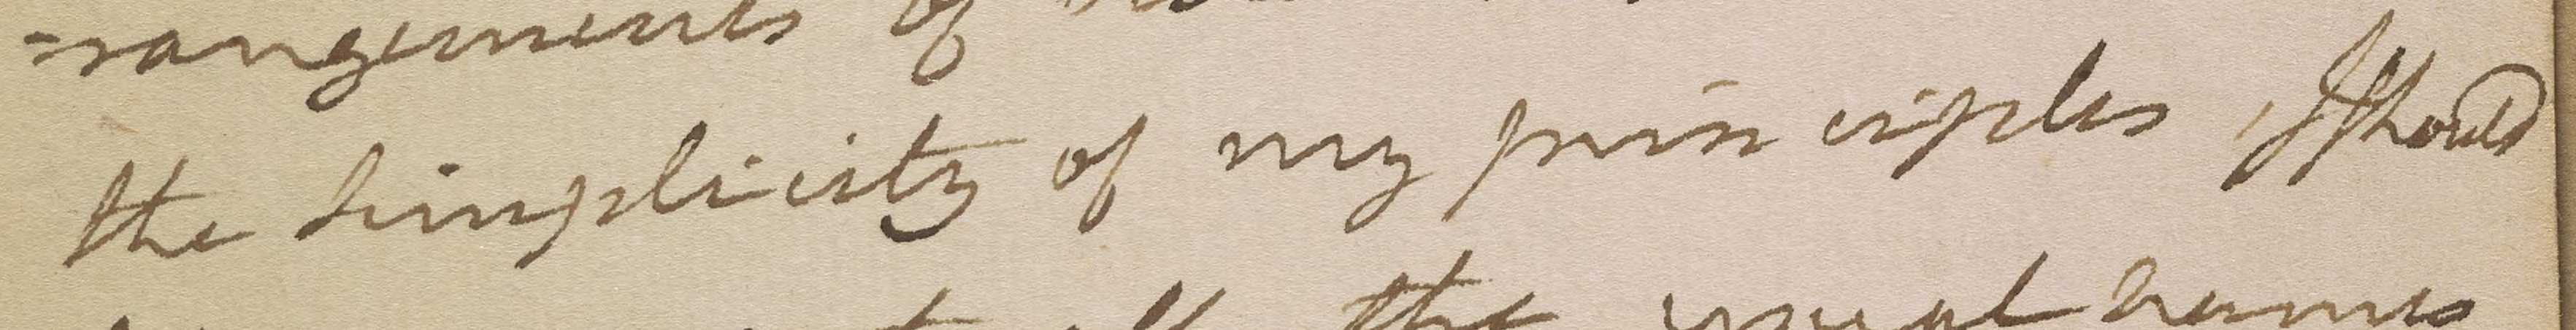the simplicity of my principles, I should
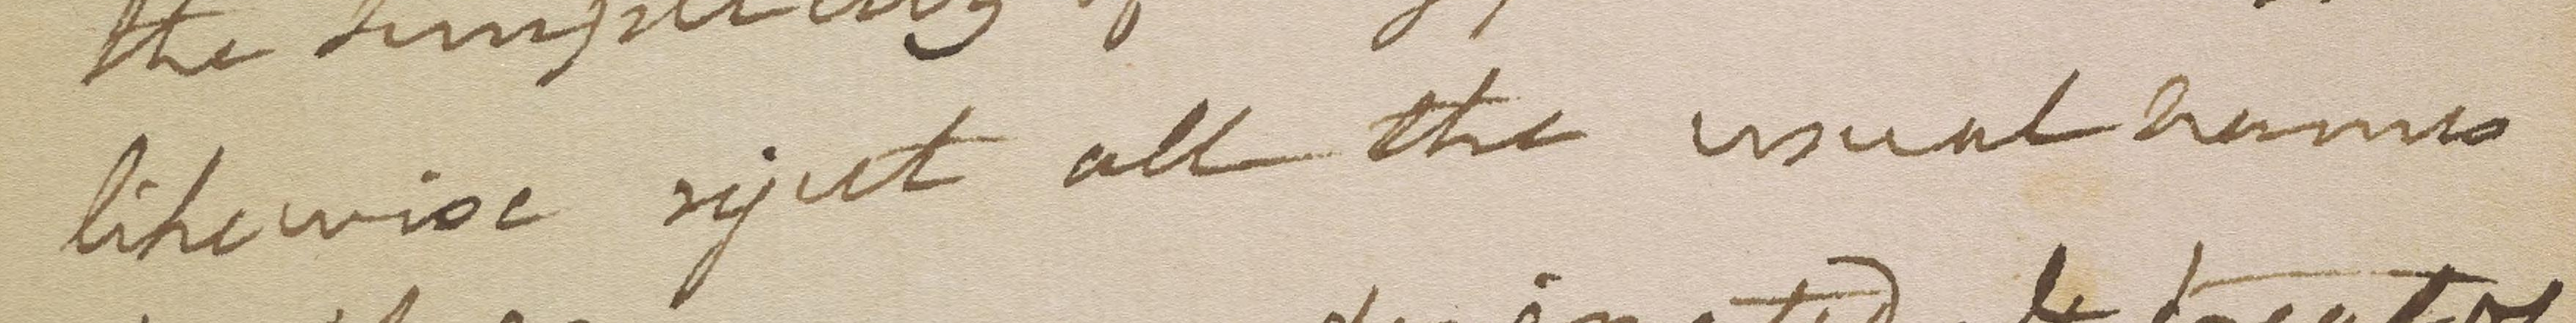likewise reject all the usual names
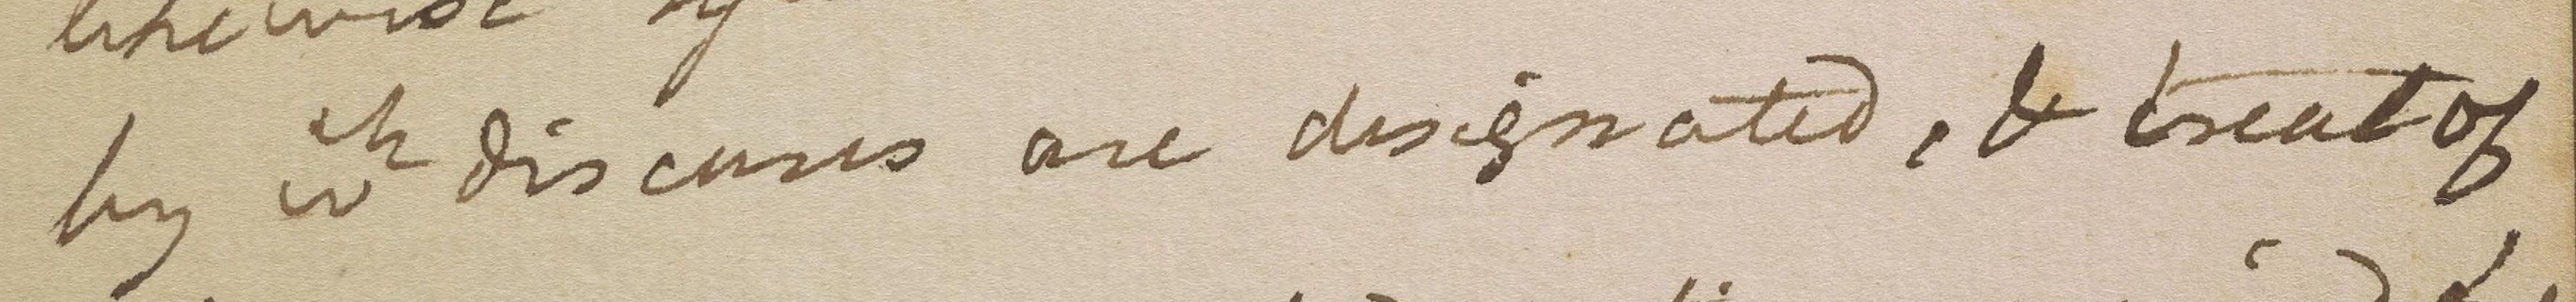by w^ch diseases are designated, & treat of
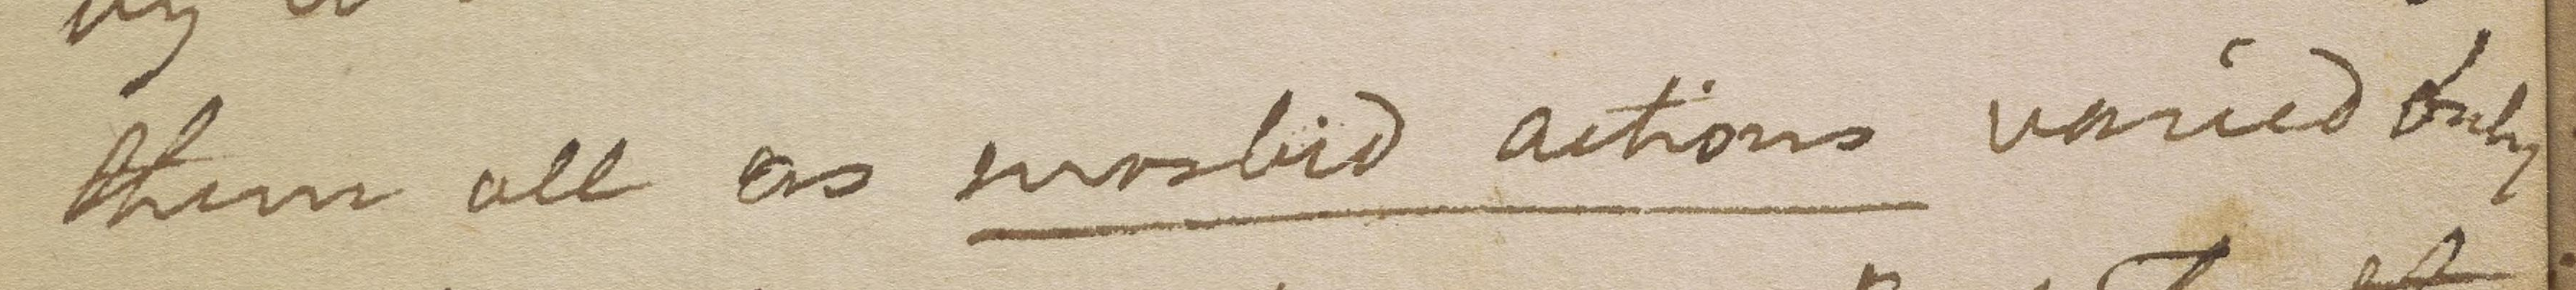them all as morbid actions varied only
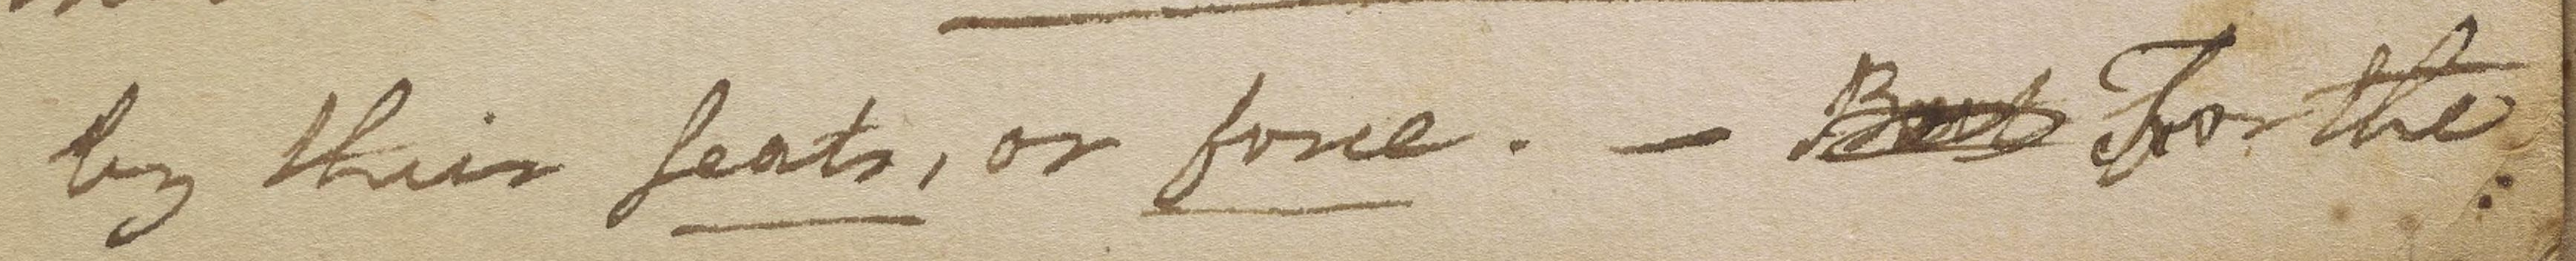by their seats, or force.- [But] For the
